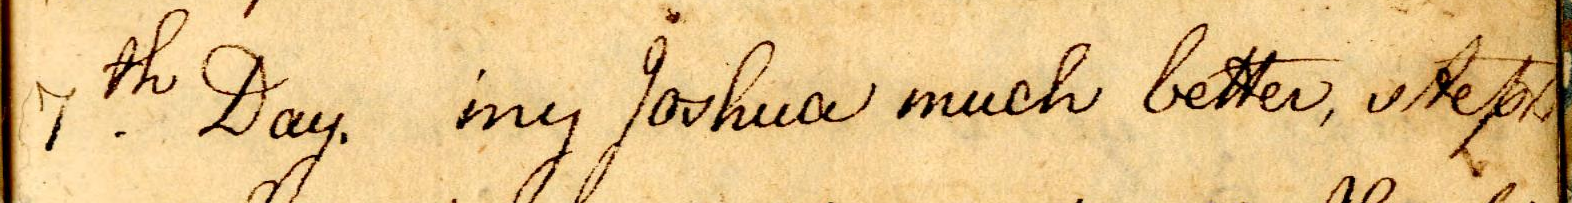7^th Day. my Joshua much better, stept
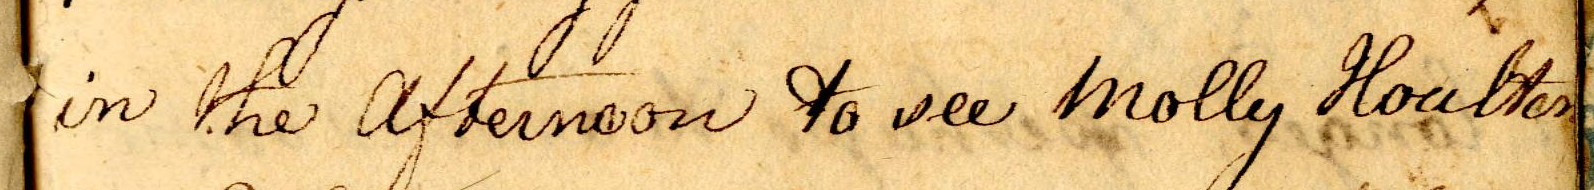in the Afternoon to see Molly Houlton
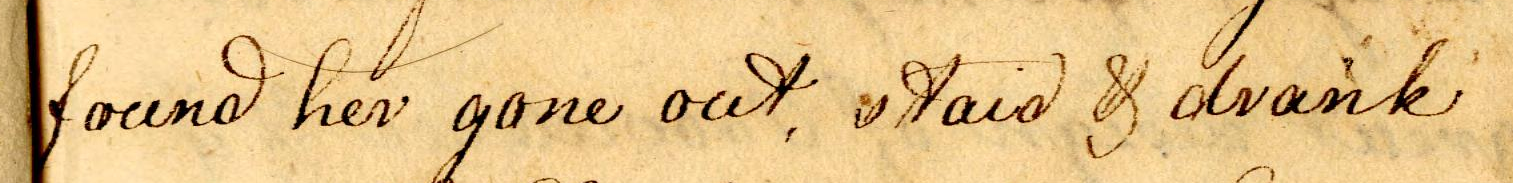found her gone out, staid & drank
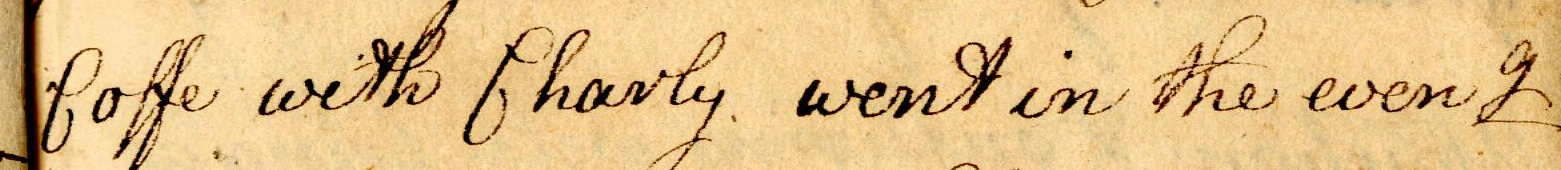Coffe with Charly. went in the even^g
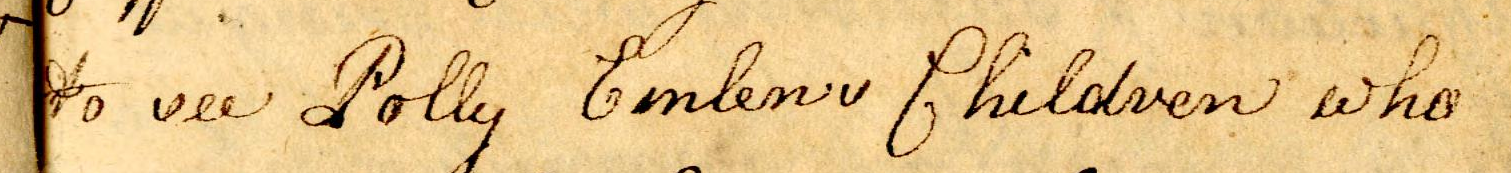to see Polly Emlens Children who
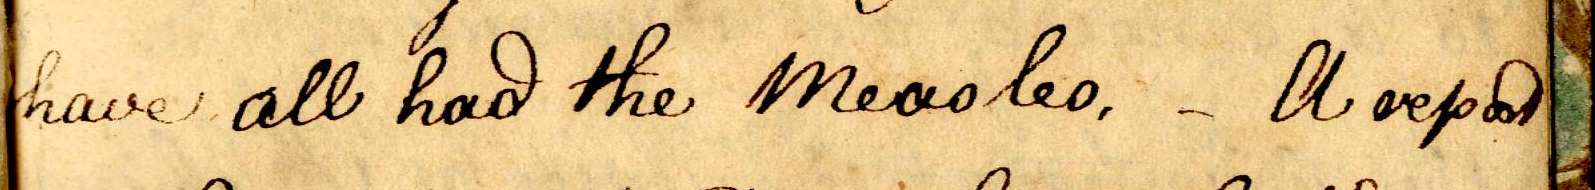have all had the Measles,- A report
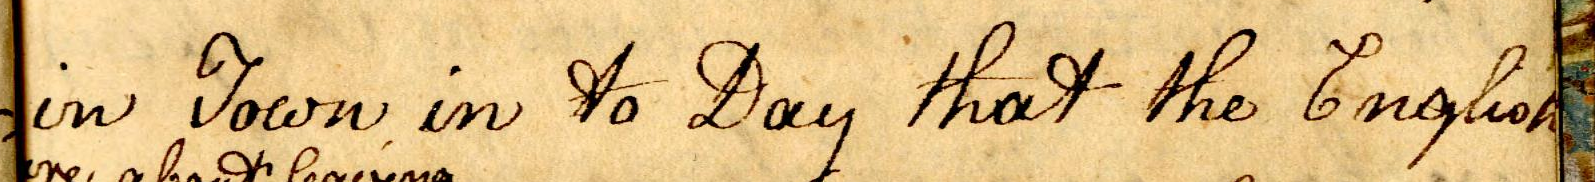in Town, in to Day that the English
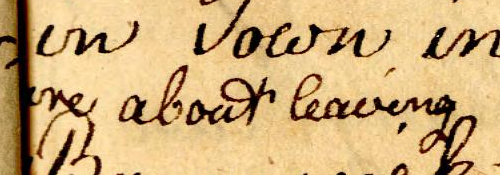are about leaving
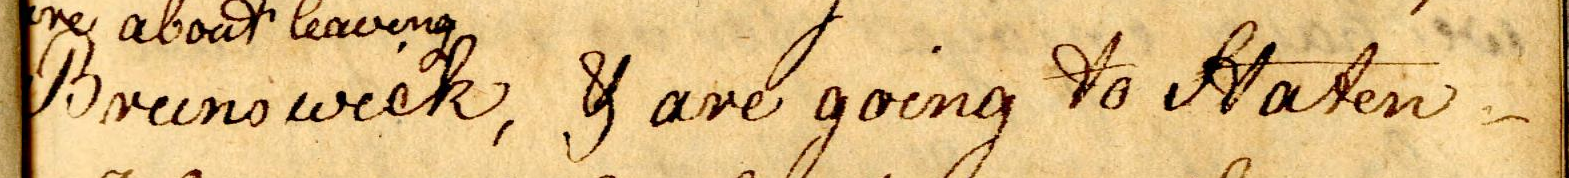Brunswick, & are going to Staten -
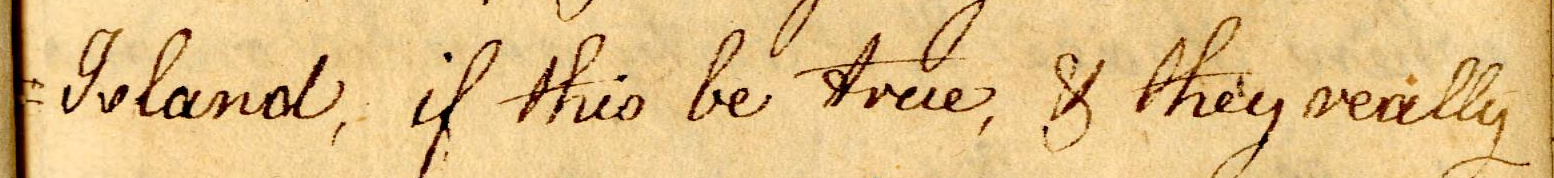-Island, is this be true, & they really
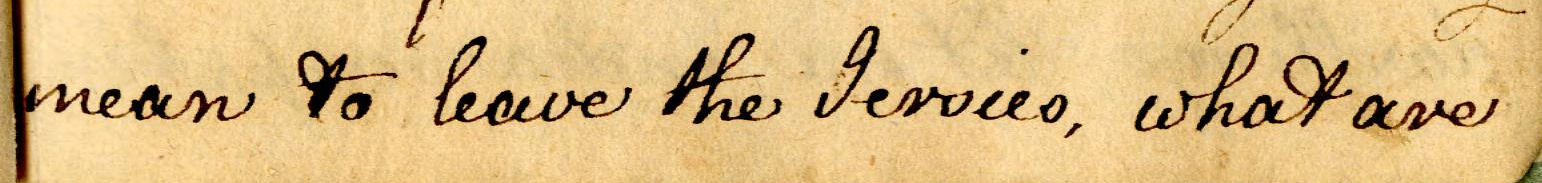mean to leave the Jersies, what are
